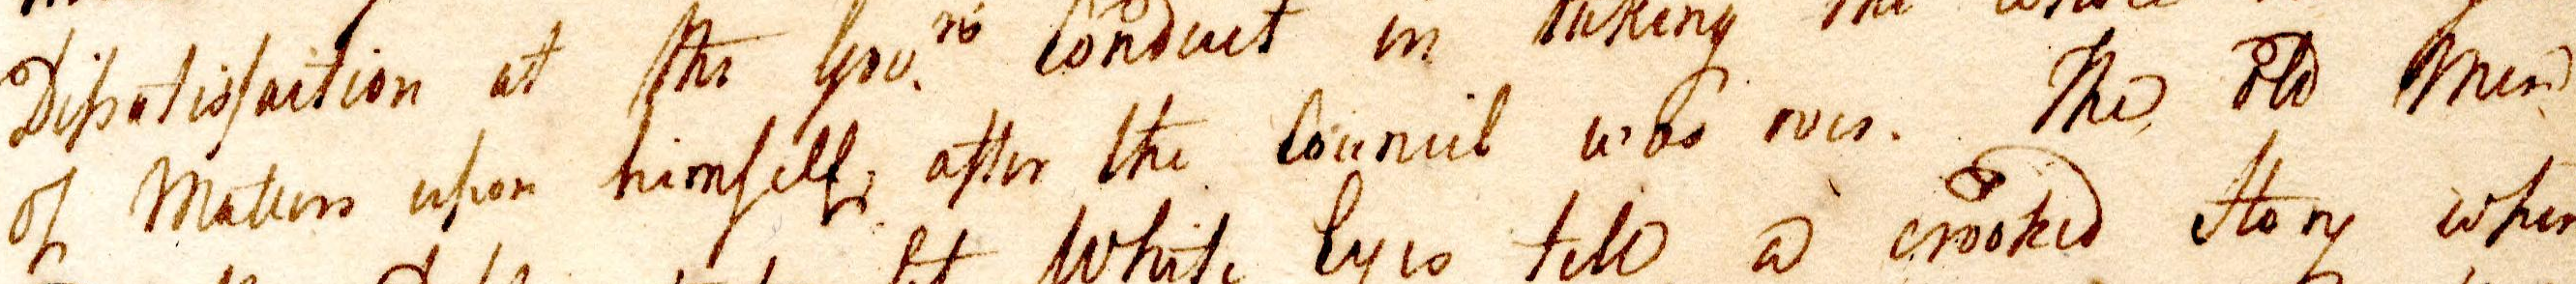of Matters upon himself, after the Council was over. The old Men
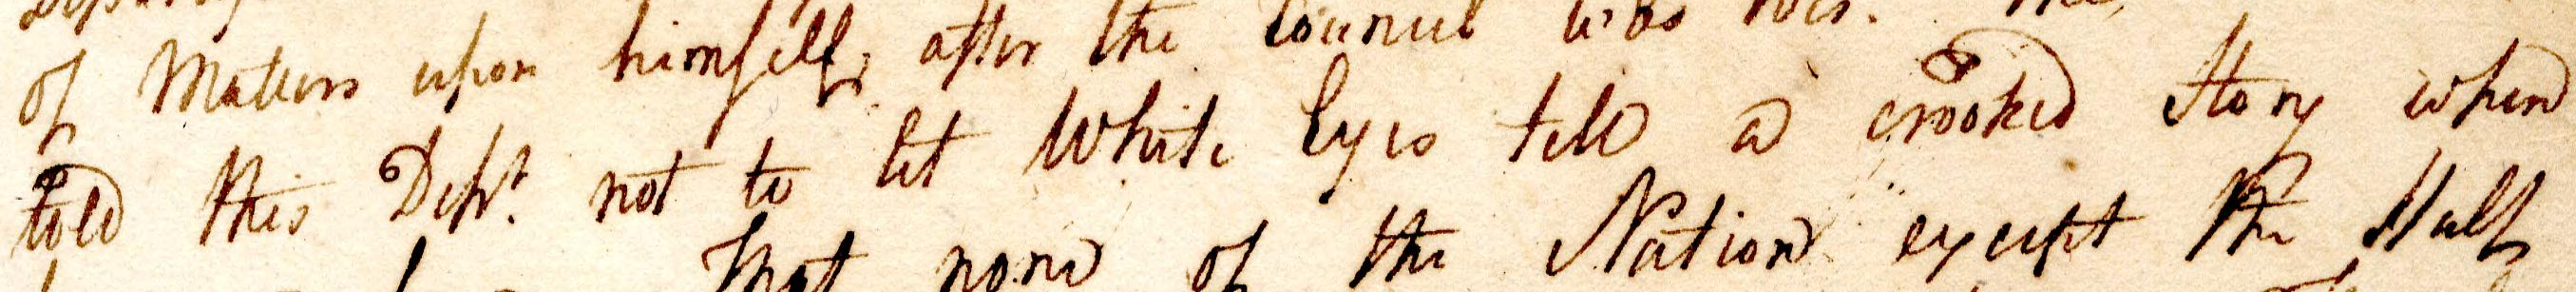told this Dep^t. not to let White Eyes tell a crooked Story when
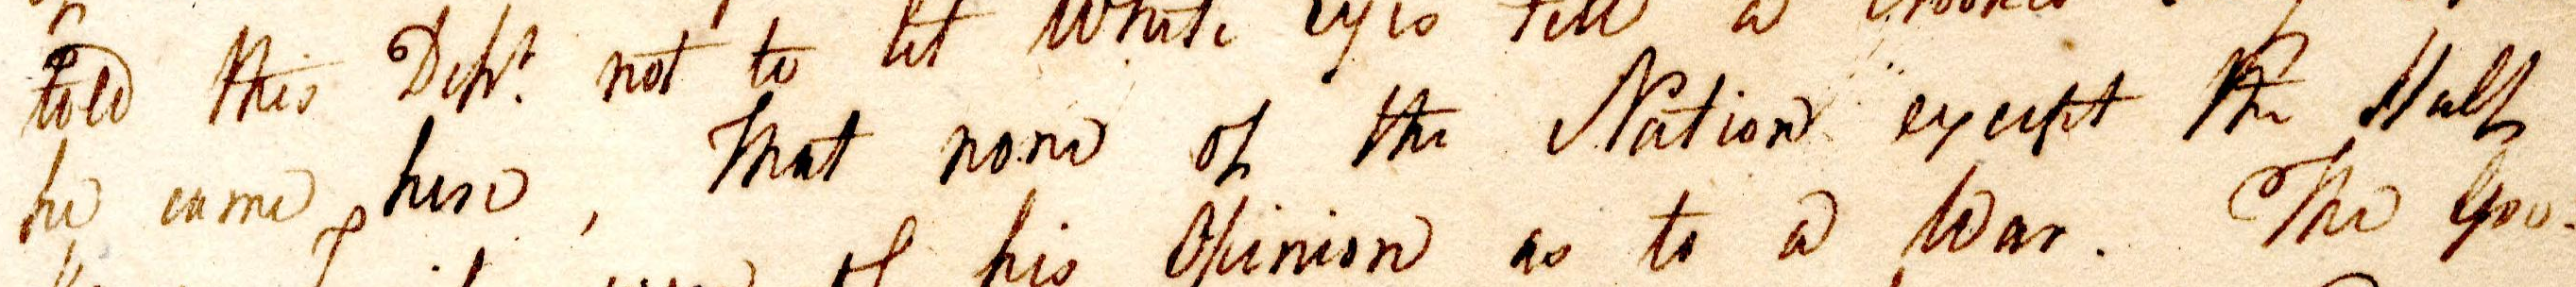he came here, That none of the Nation except the Half
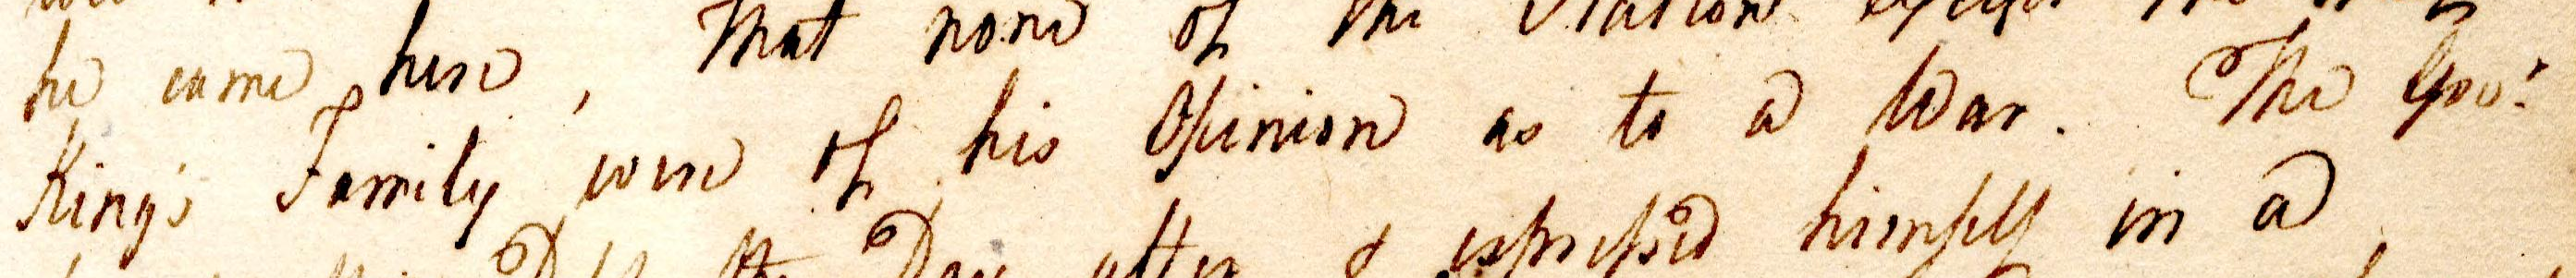King's Family were of his Opinion as to a War. The Gov^r.
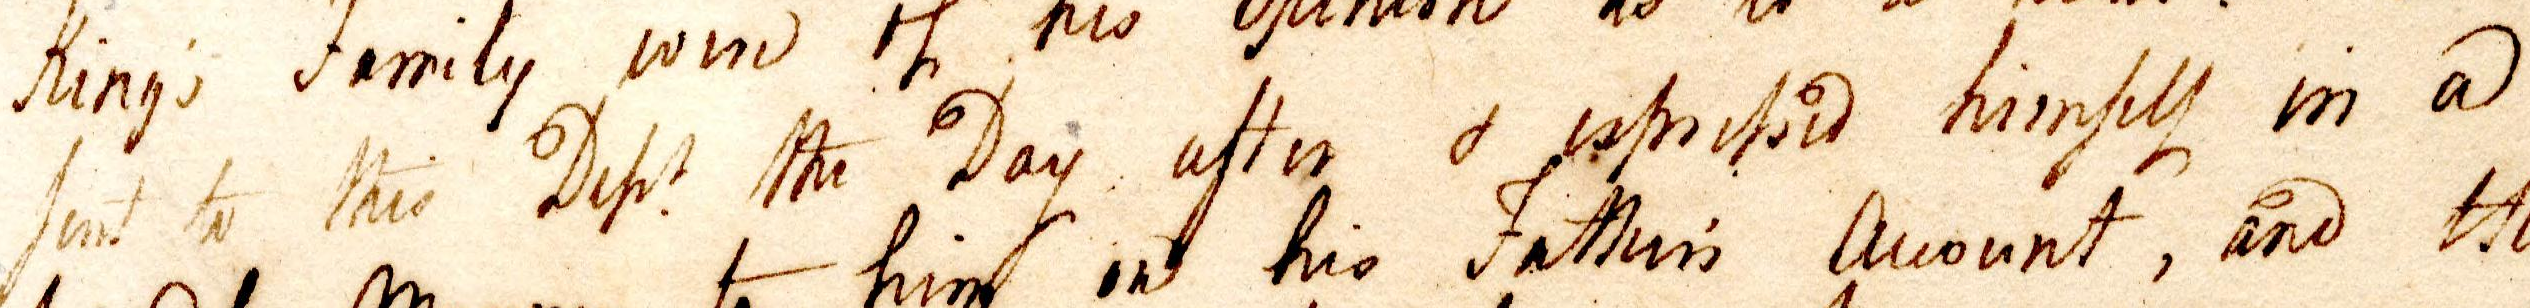sent to this Dep^t. the Day after & espoused himself in a
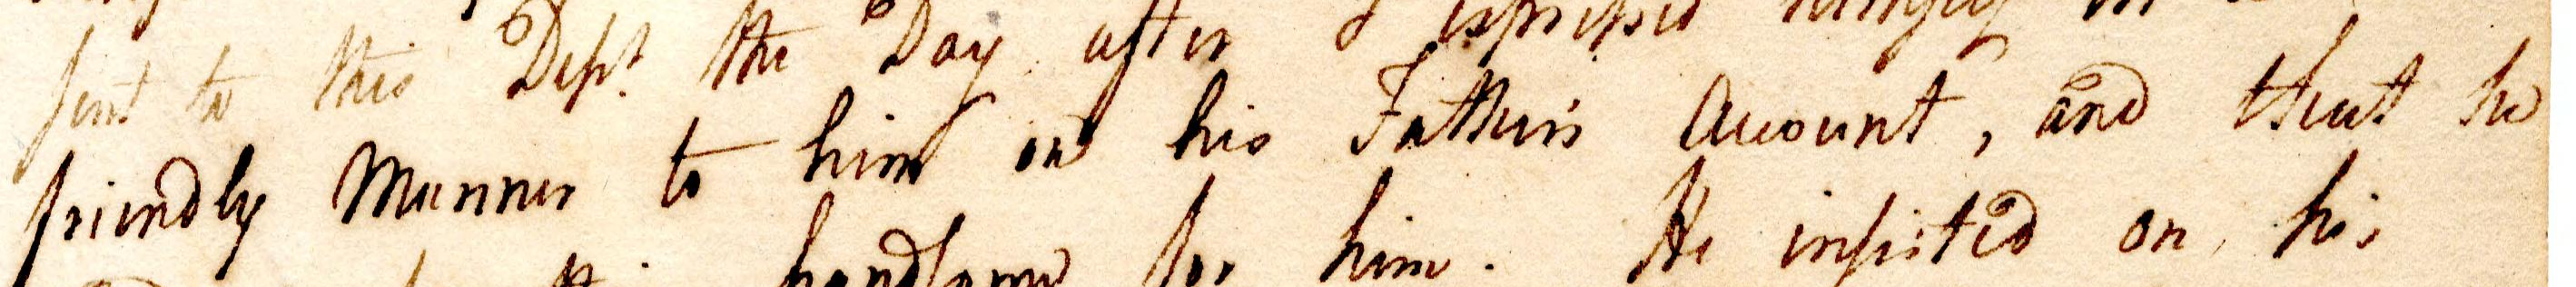friendly Manner to him on his Father's Account, and that he
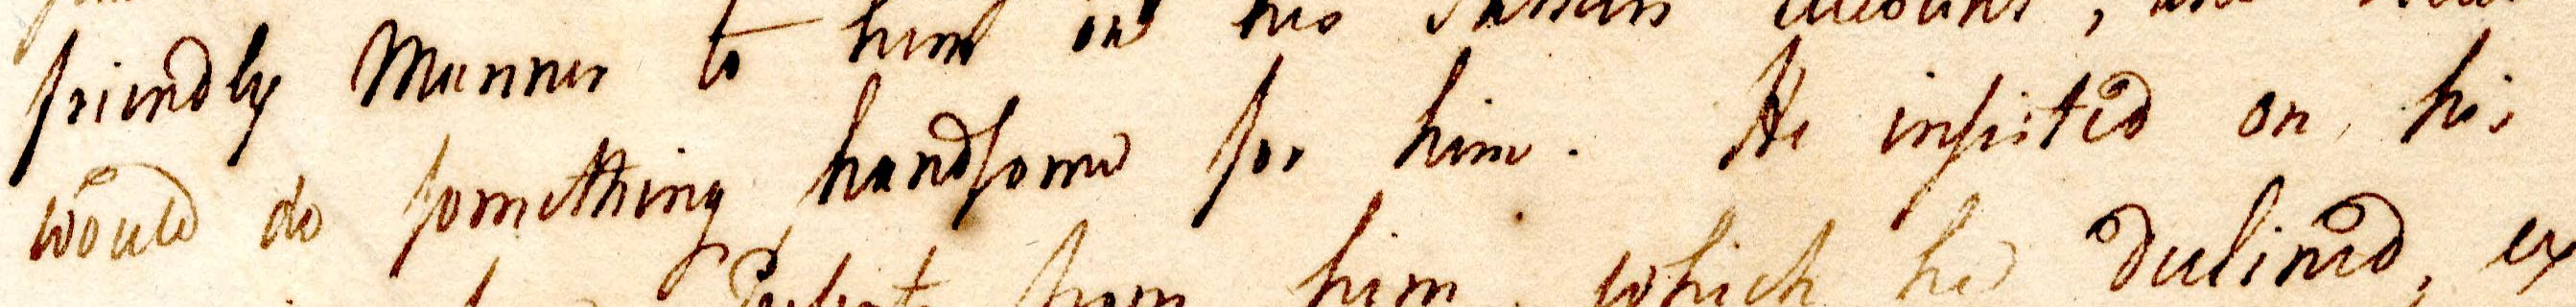would do something handsome for him. He insisted on his
